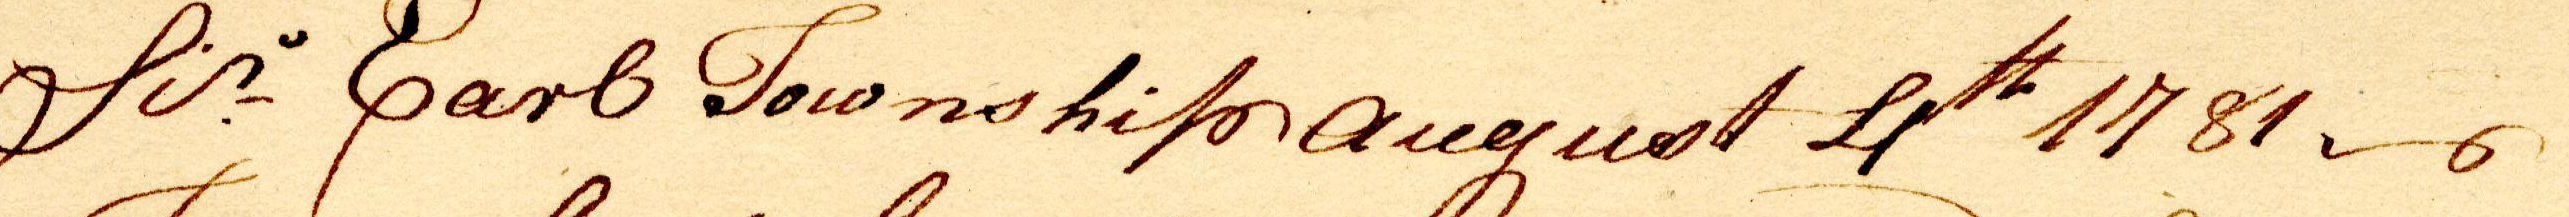Sir Earl Township august 4^th 1781
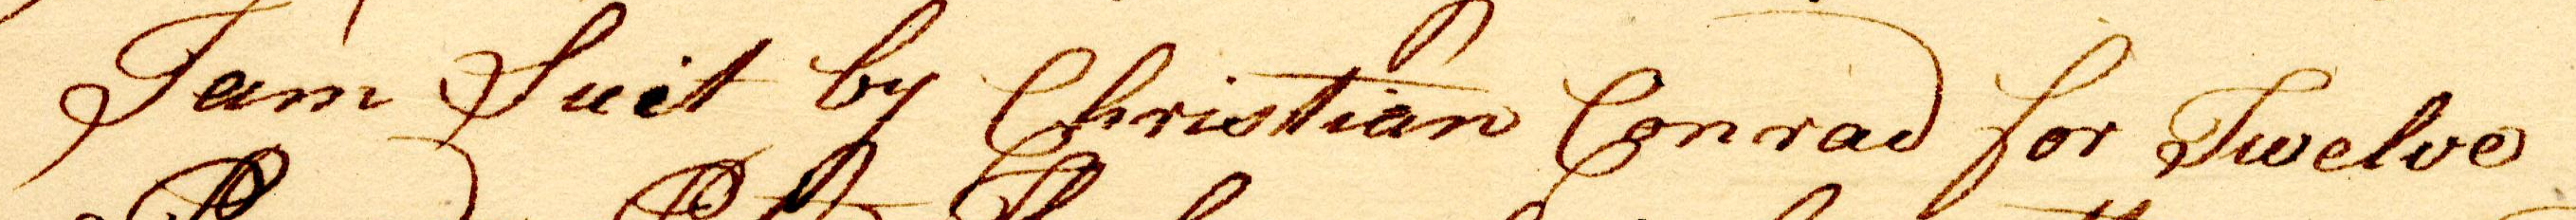I am Suit by Christian Conrad for Twelve
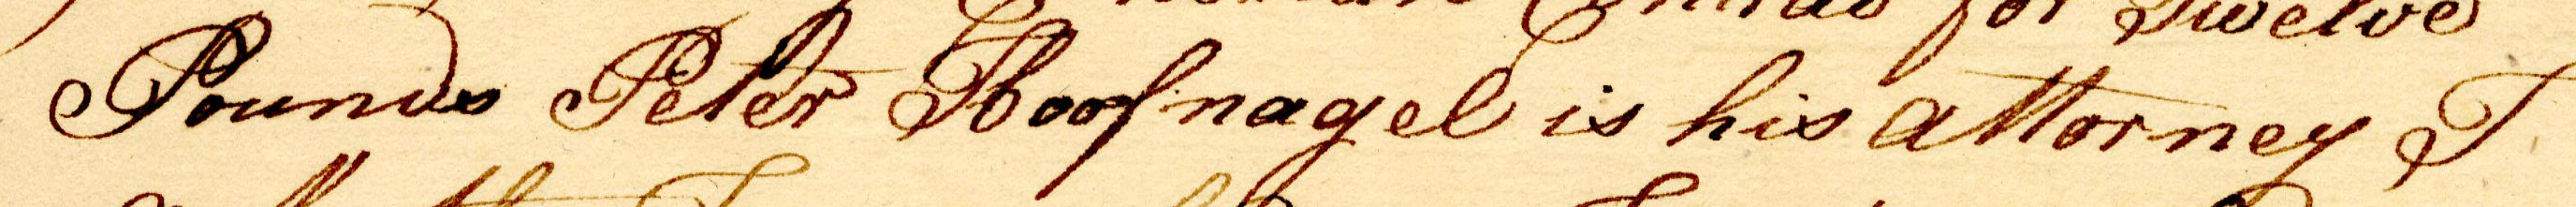Pounds Peter Hoofnagel is his attorney I
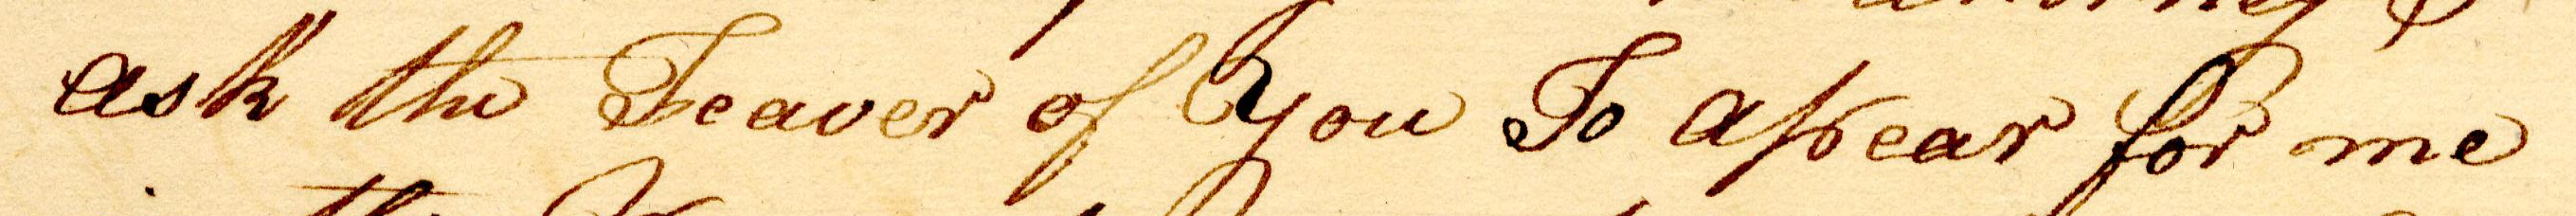ask the Feaver of You To apear for me
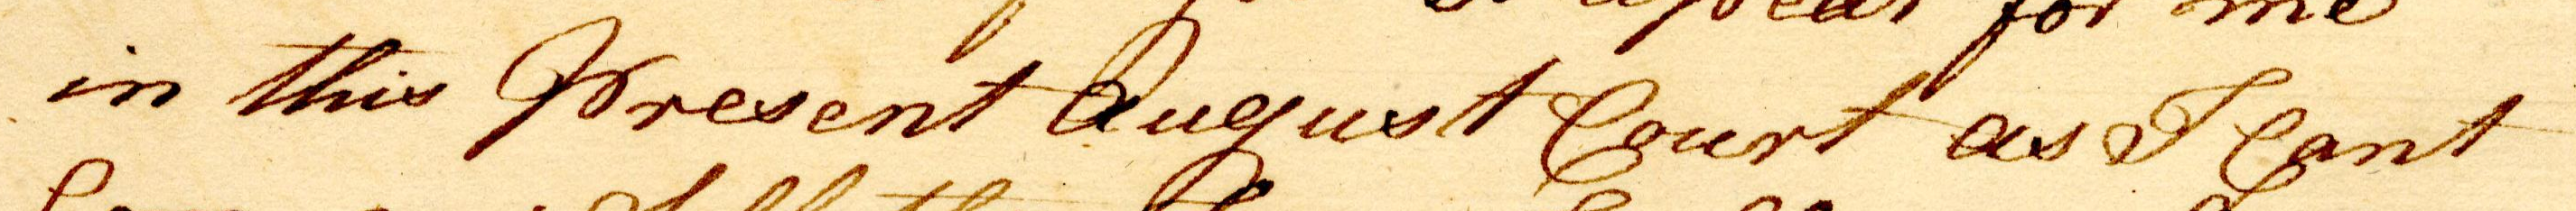in this Present August Court as I Cant
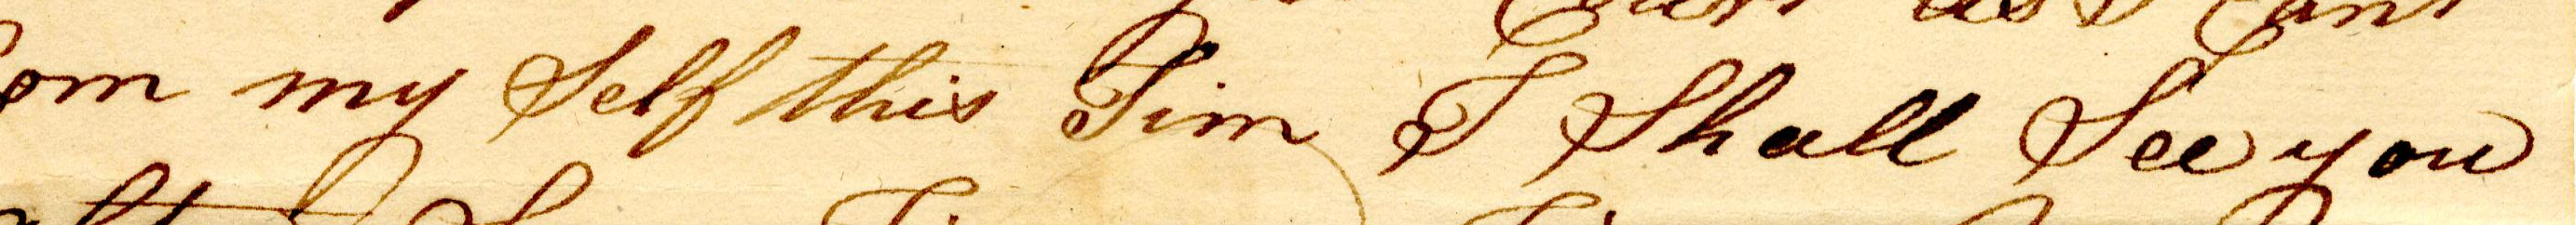Com my Self this Tim I Shall See you
